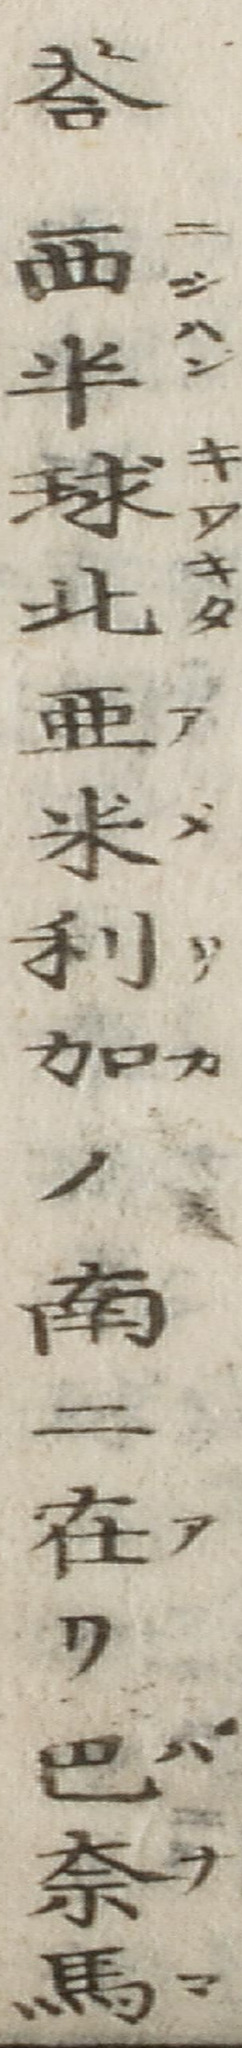答西半球北亜米利加ノ南二在リ巴奈馬
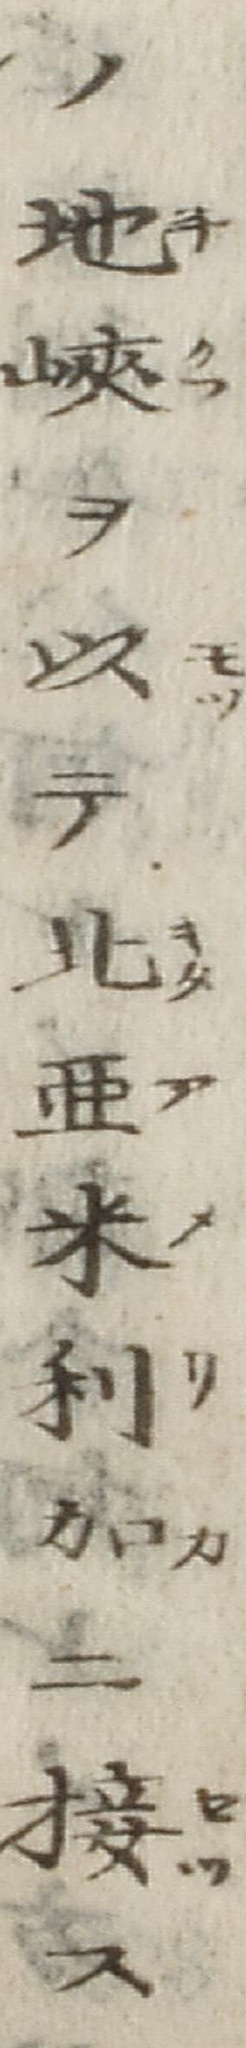ノ地峡ヲ以テ北亜米利加二接ス
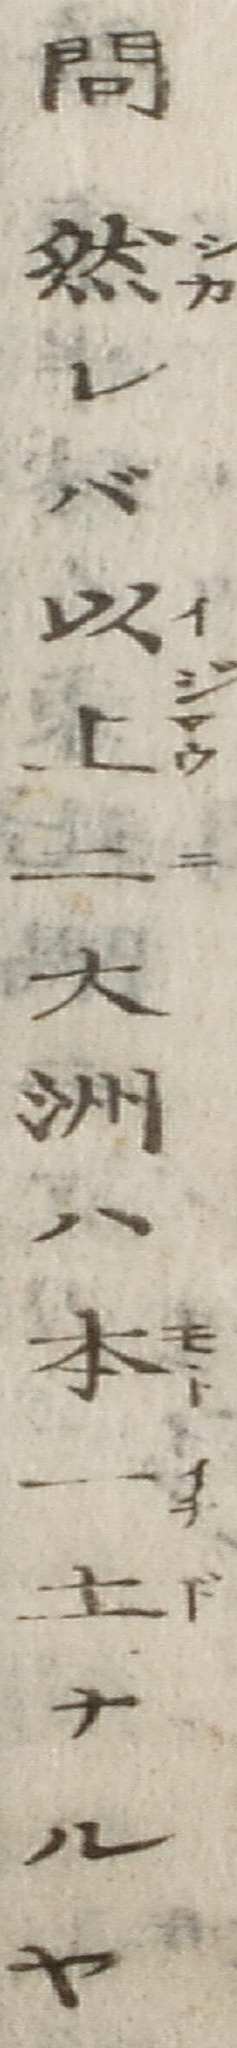問然レバ以上二大洲ハ本一土ナルヤ
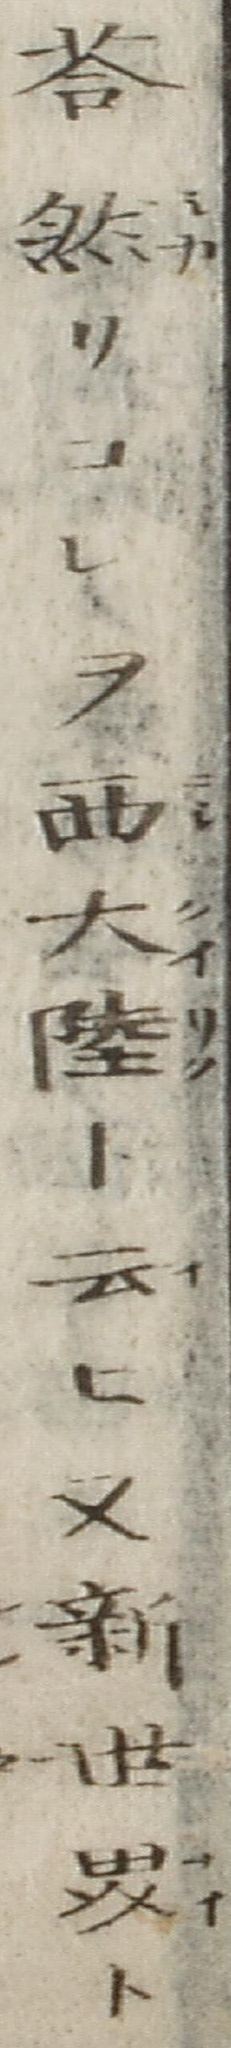答然リコレヲ西大陸ー云ヒ又新世界ト
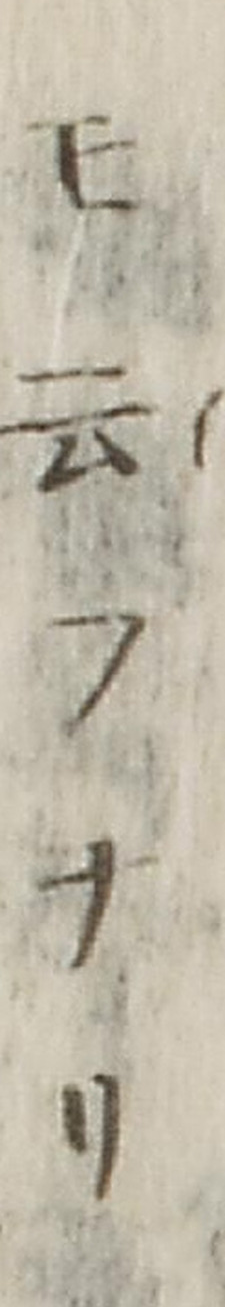モ云フナリ
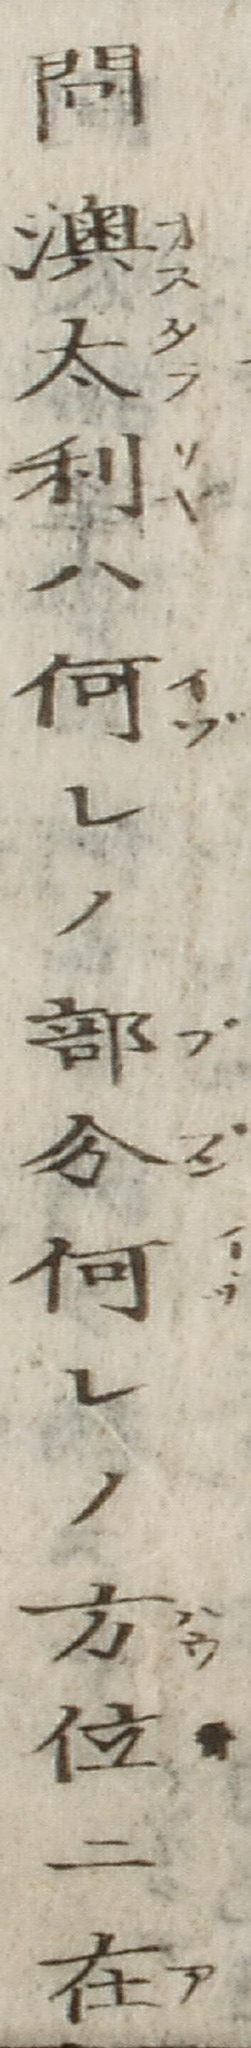問墺太利ハ何レノ部分何レノ方位二在
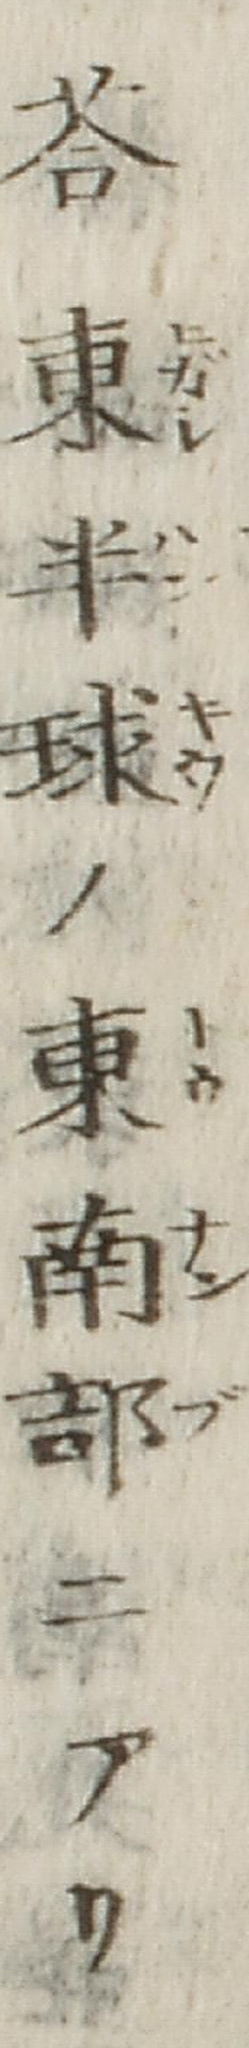答東半球ノ東南部二アリ
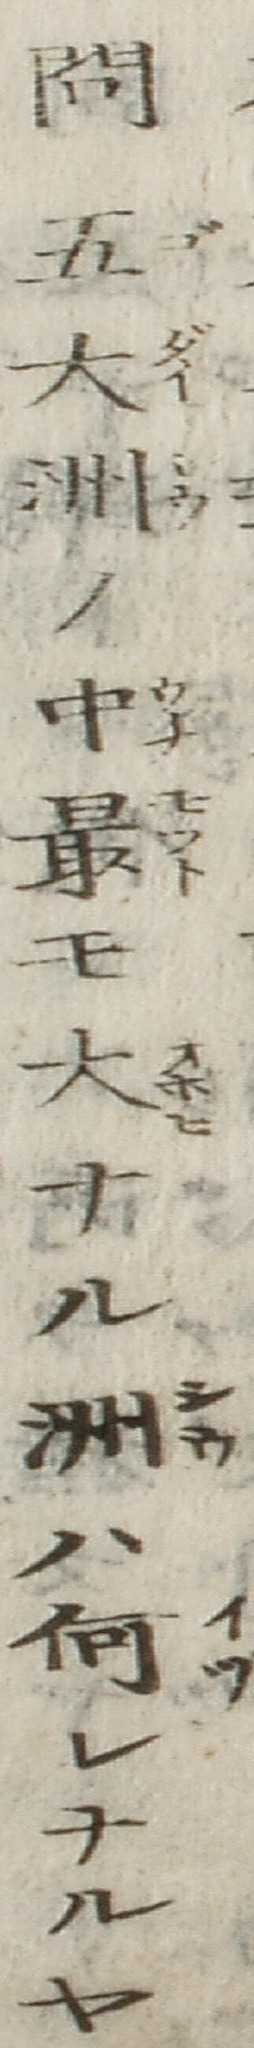問五大洲ノ中最モ大ナル洲ハ何レナルヤ
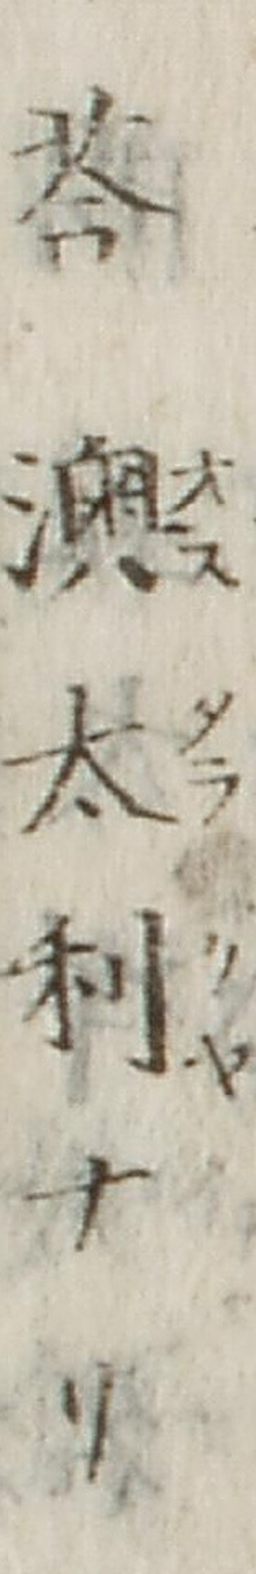答墺太利ナリ
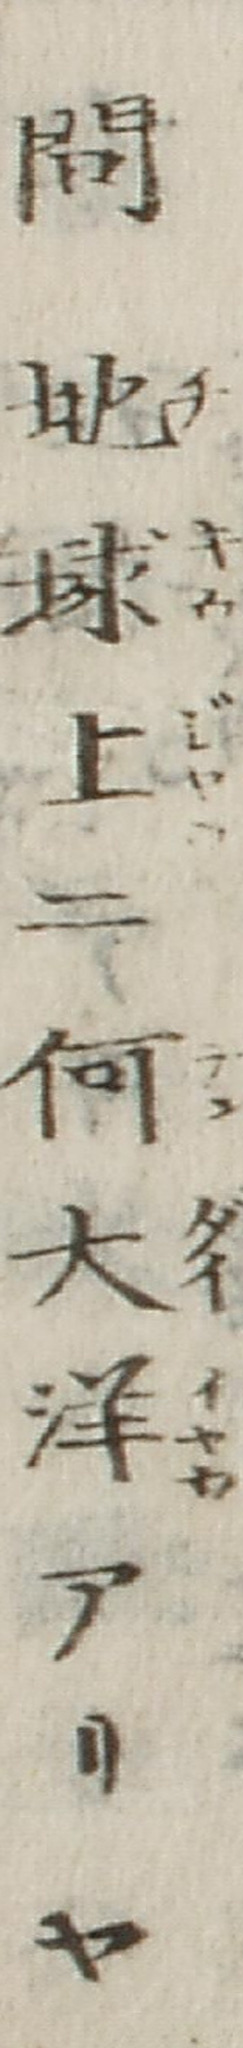問地球上ニ何大洋アリヤ

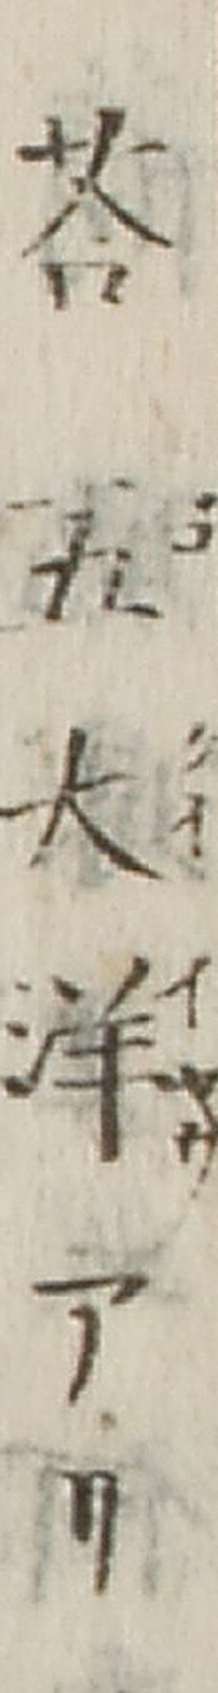答五大洋アリ
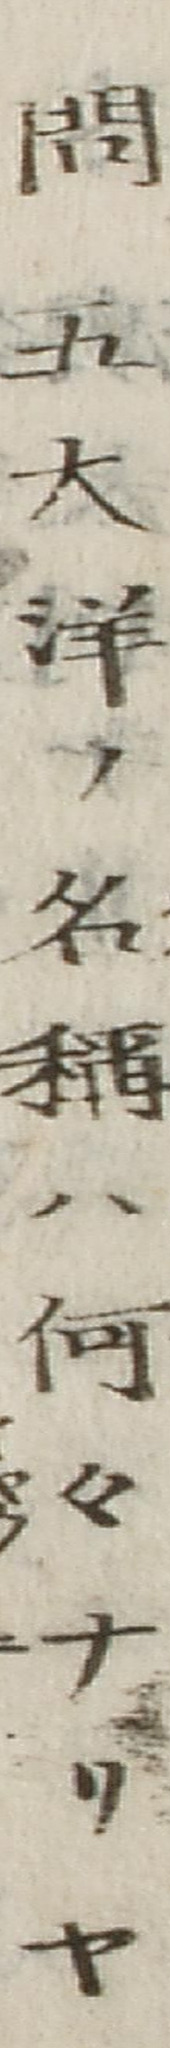問五大洋ノ名称ハ何々ナリヤ
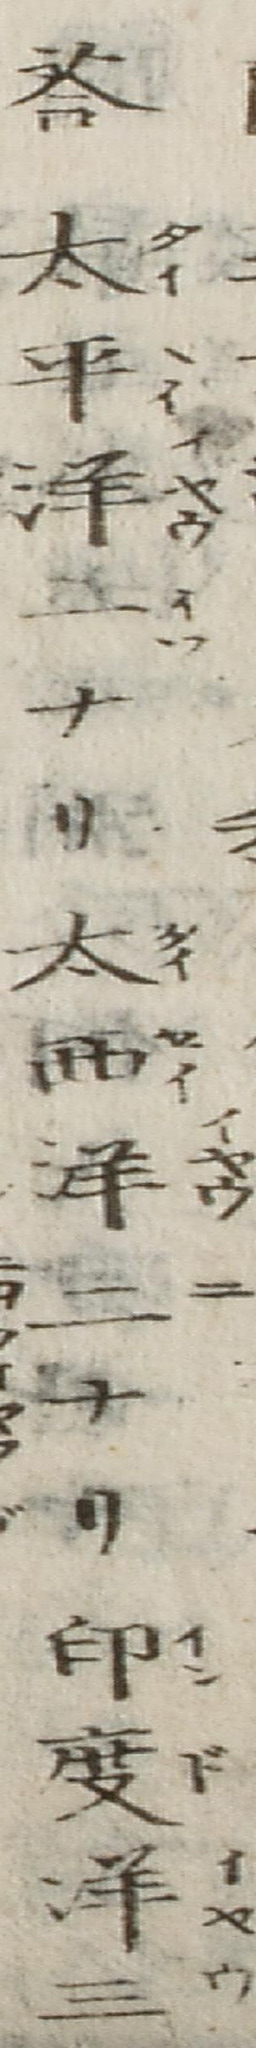答太平洋一ナリ太西洋二ナリ印度洋三
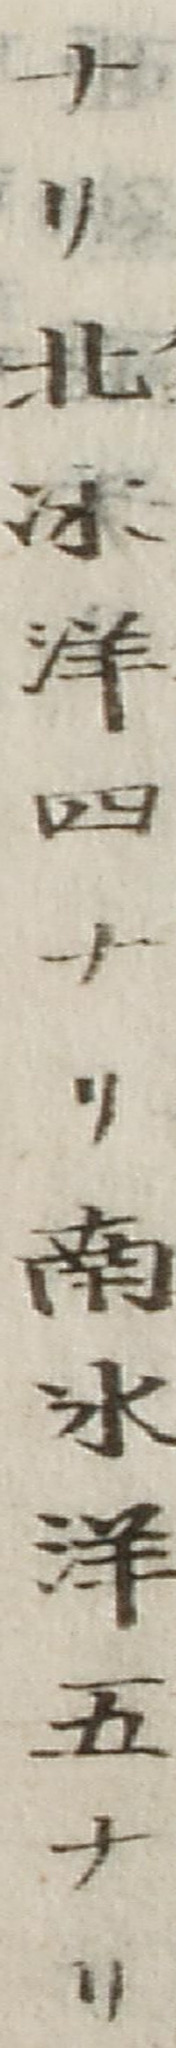ナリ北冰洋四ナリ南氷洋五ナリ
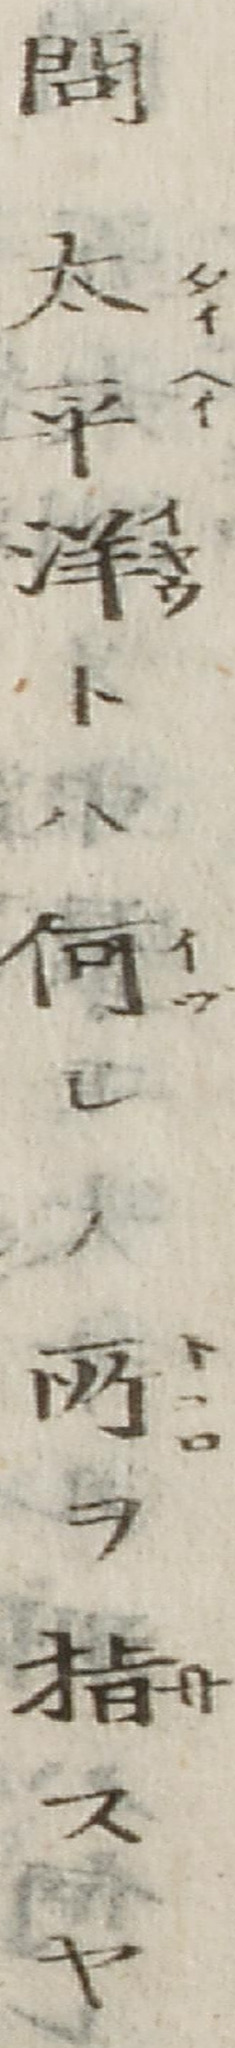問太平洋トハ何レノ所ヲ指スヤ
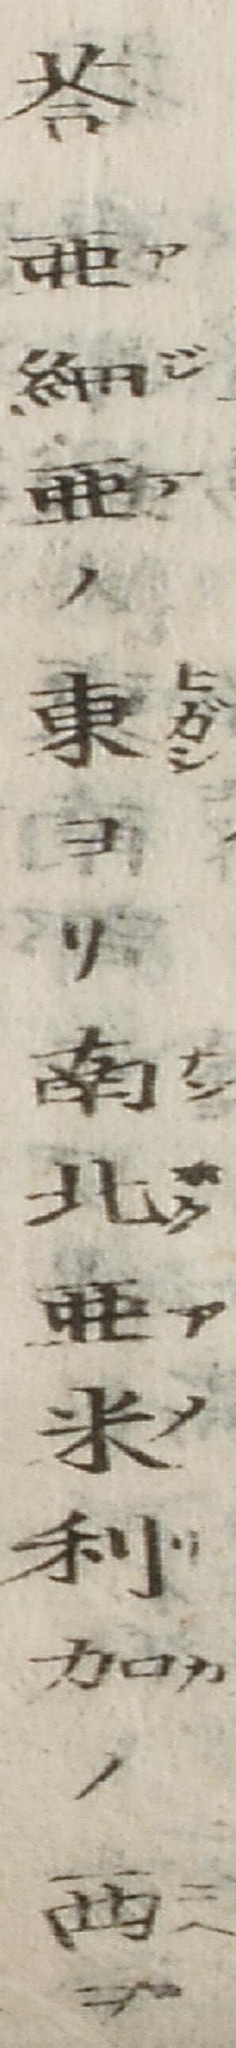答亜細亜ノ東ヨリ南北亜米利加ノ西ヲ
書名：地球儀問答　全
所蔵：東京大学地震研究所図書室 Earthquake Research Institute Library, The University of Tokyo, JAPAN
